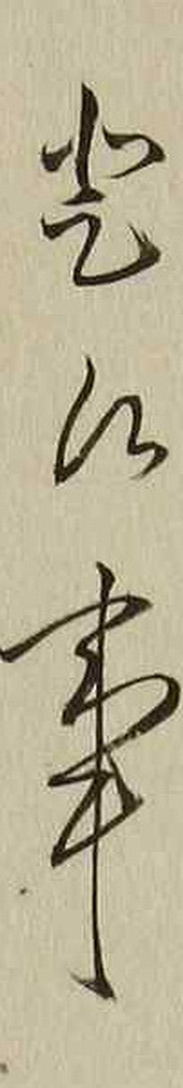置候事
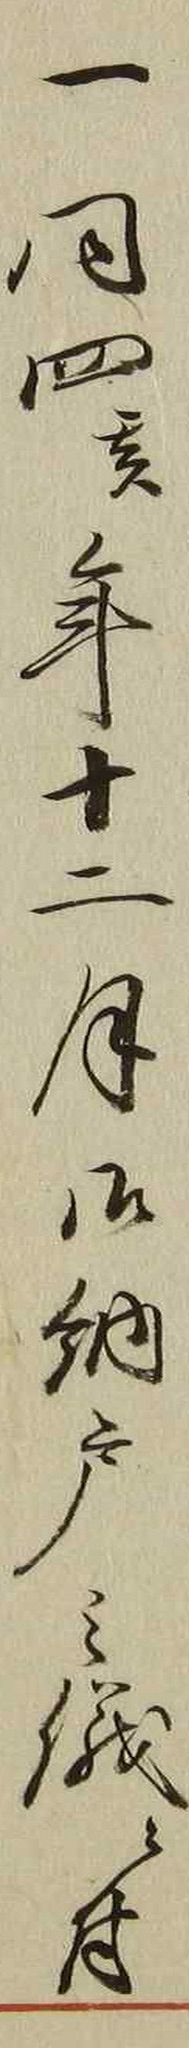一同四亥年十二月御納戸之儀ニ付
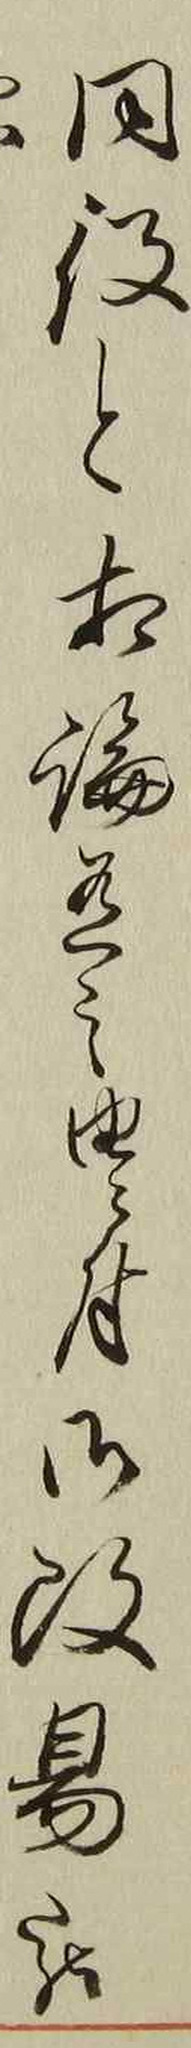同役と相論有之由ニ付御改易被
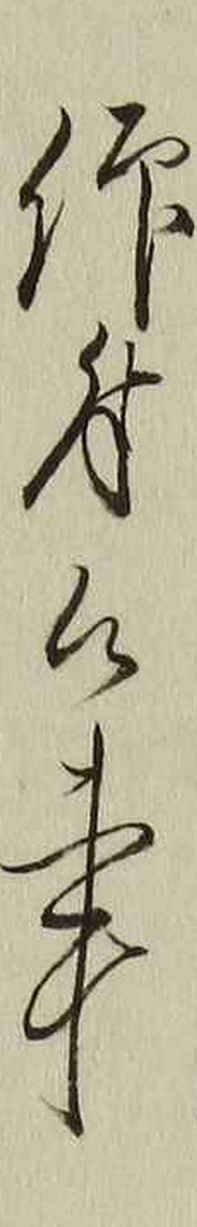仰付候事
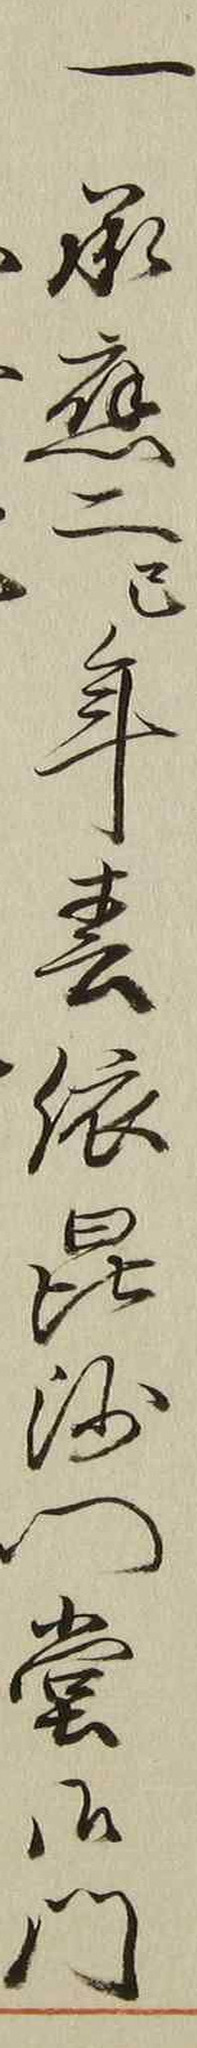一承応二巳年春依毘沙門堂御門
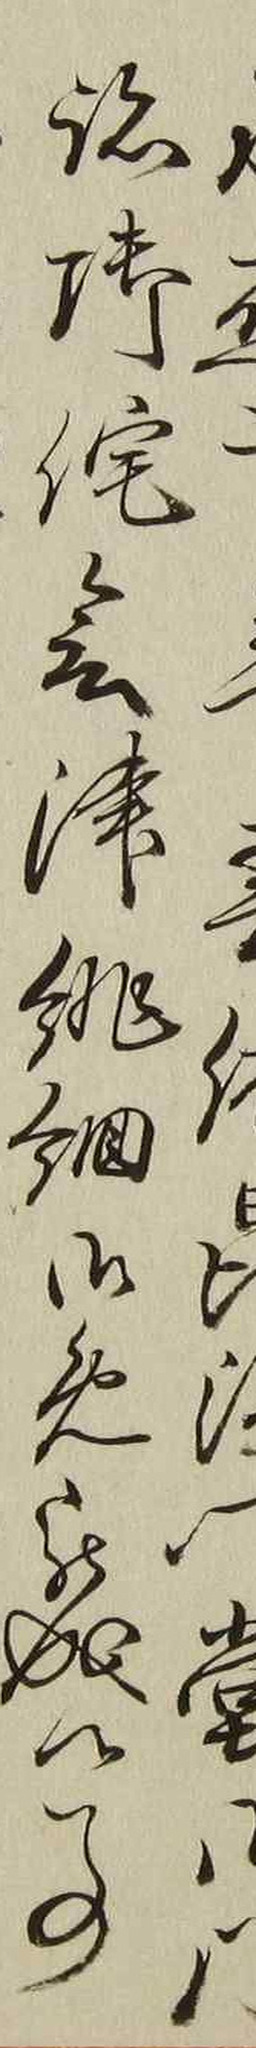跡御侘会津徘徊御免被成候事
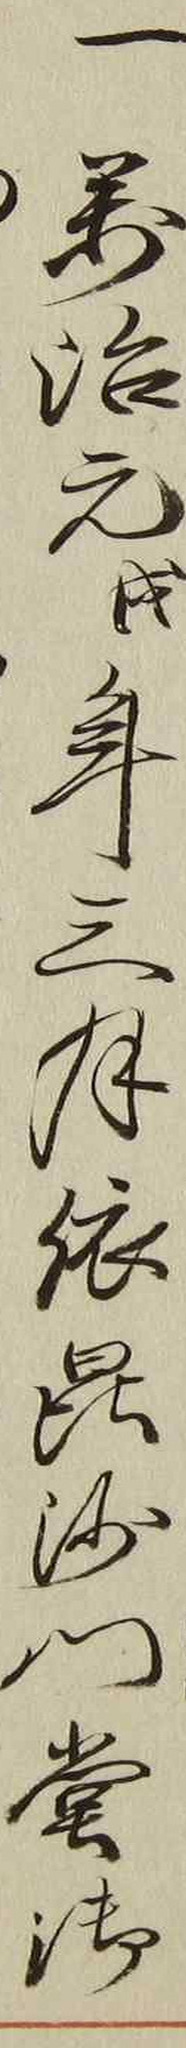一万治元戌年三月依毘沙門堂御
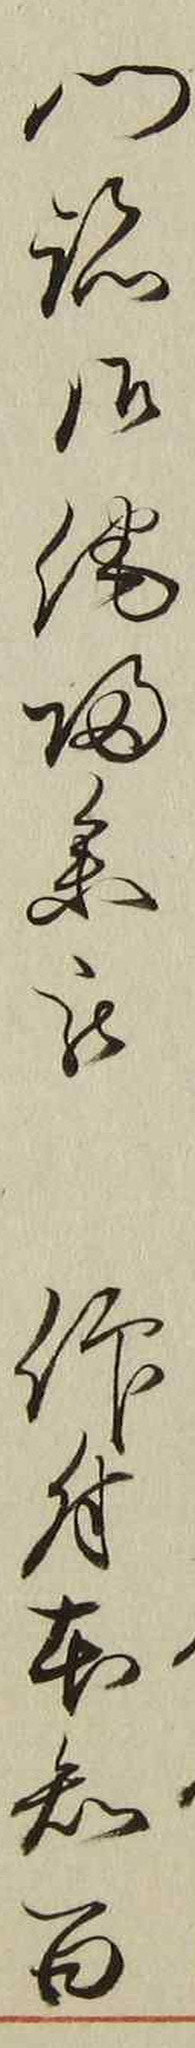門跡御帰参被仰付本知百
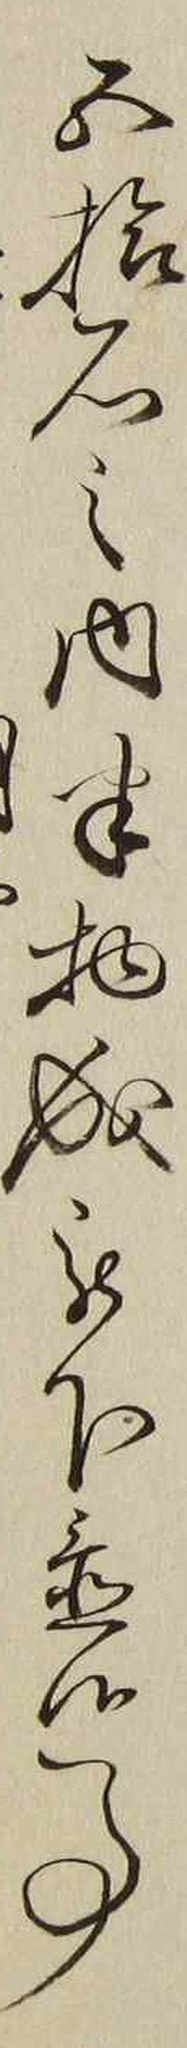五拾石之内半物成被下置候事
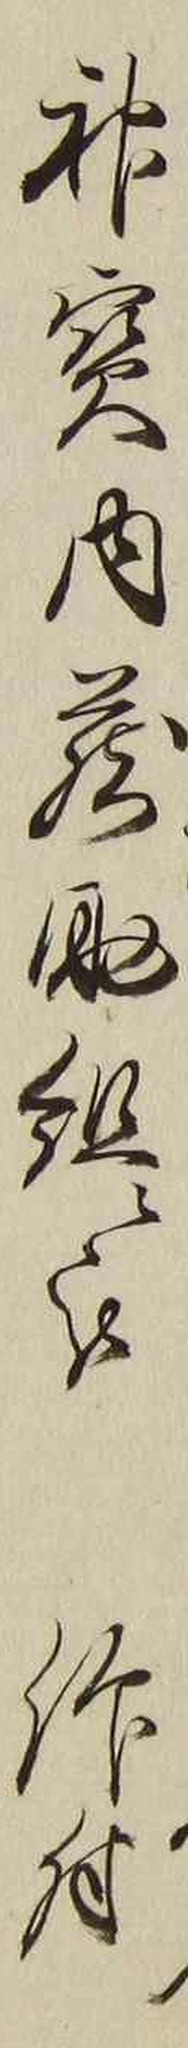神宝内蔵助組ニ被仰付
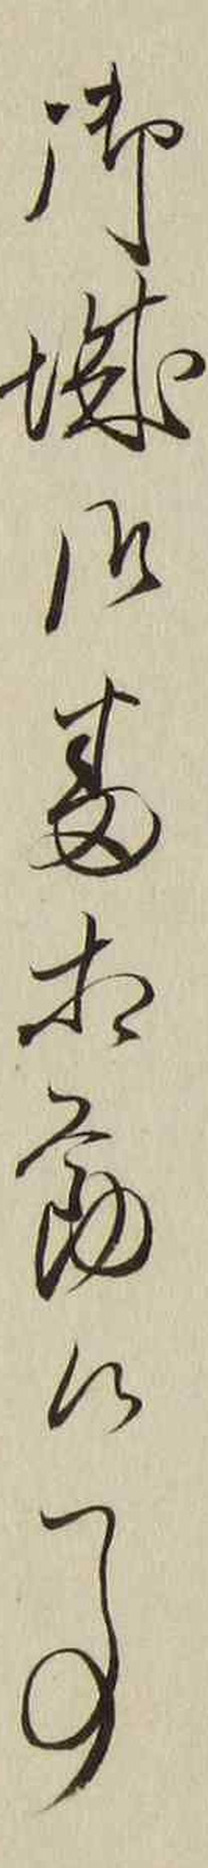御城御番相勤候事

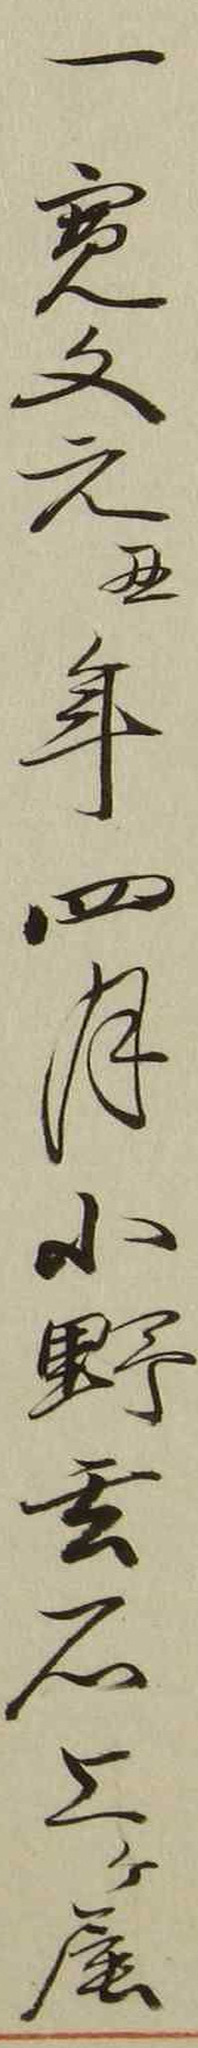一寛文元丑年四月小野玄石上ヶ屋
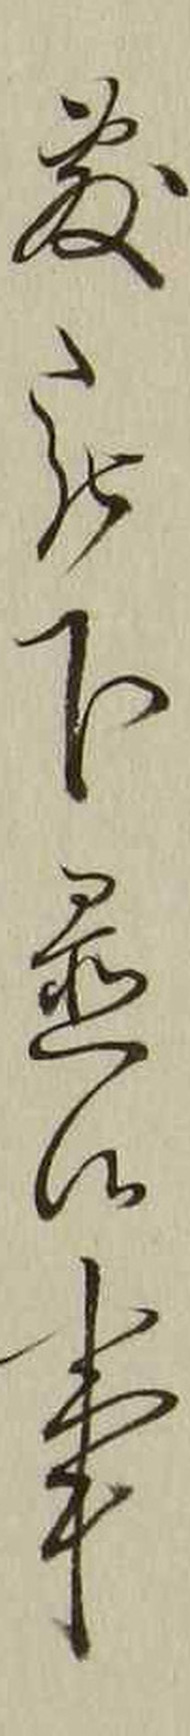敷被下置候事
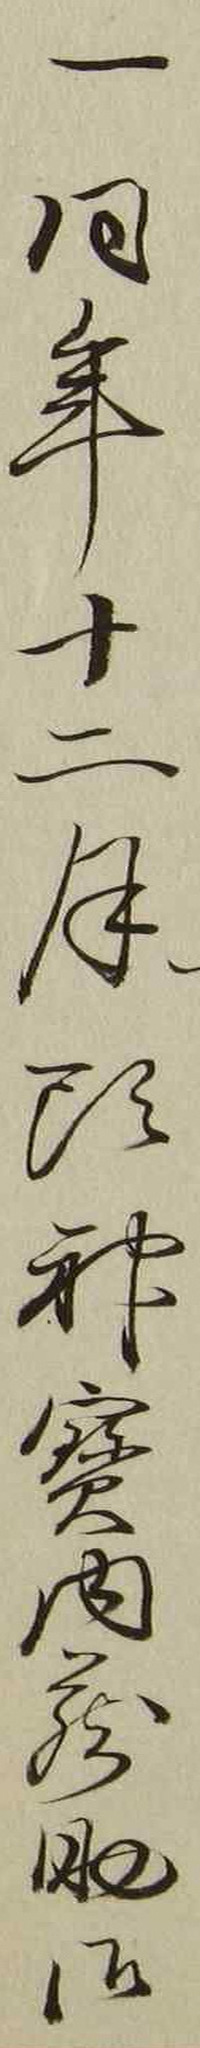一同年十二月頭神宝内蔵助御
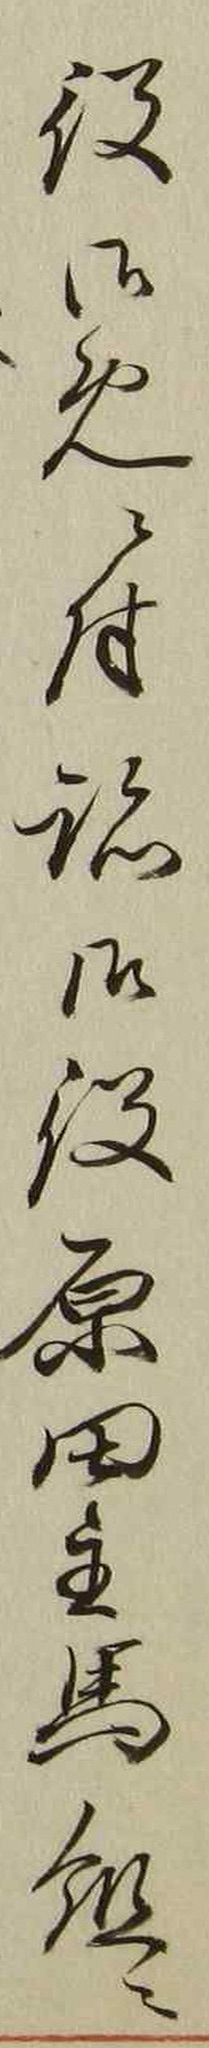役御免ニ付跡役原田主馬組ニ
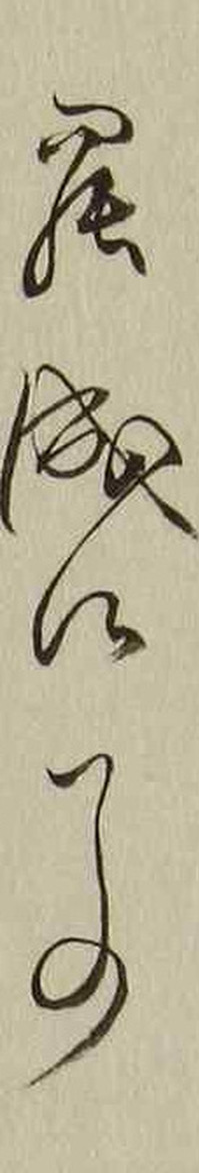罷成候事
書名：諸士系譜　巻之54　ほ之部1
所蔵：会津若松市立会津図書館
